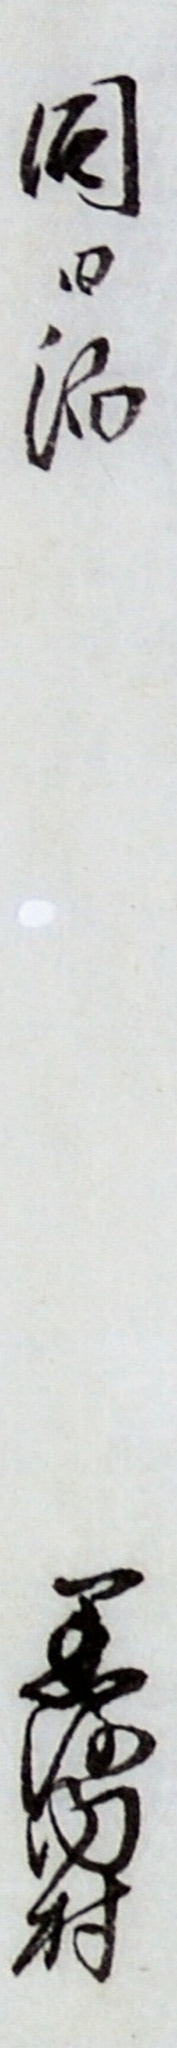同日泊黒河内村

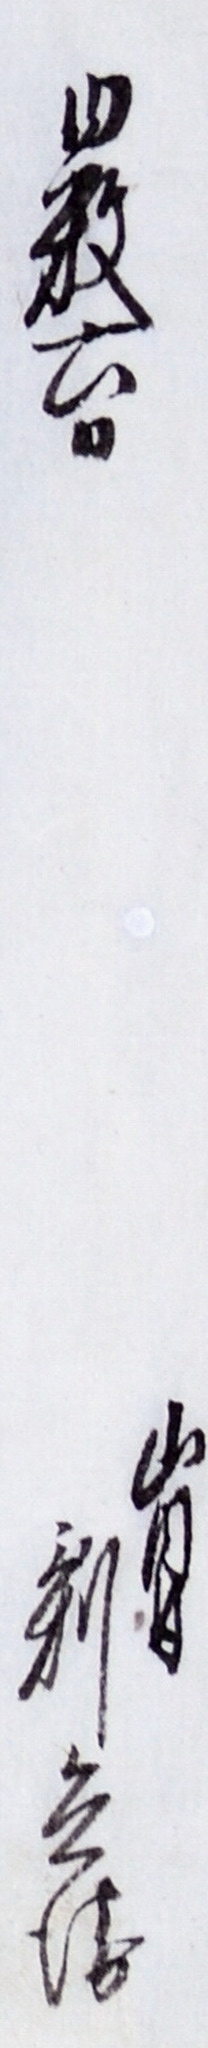日数六日新兵衛
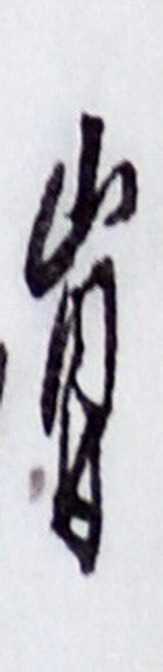山目付
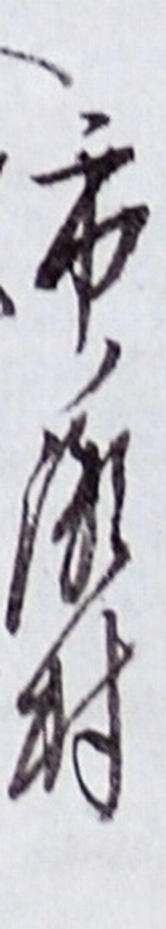市ノ瀬村
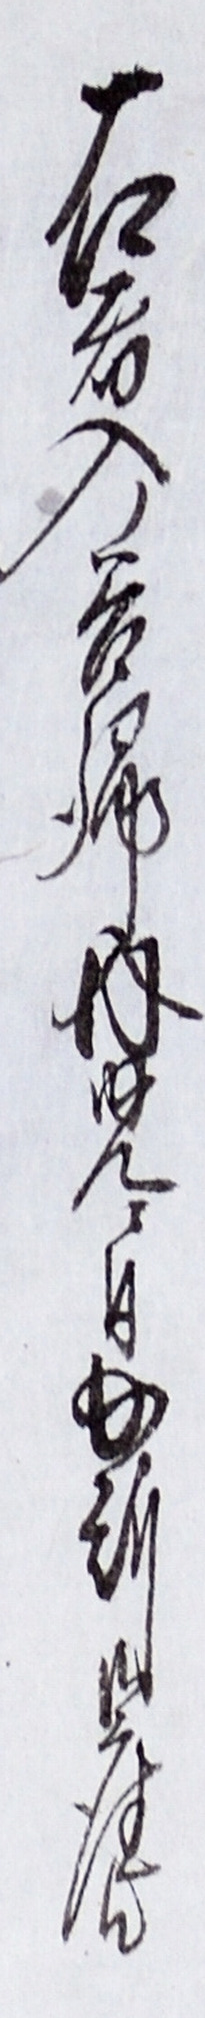右は入ノ谷郷内見ニ付本所御座候
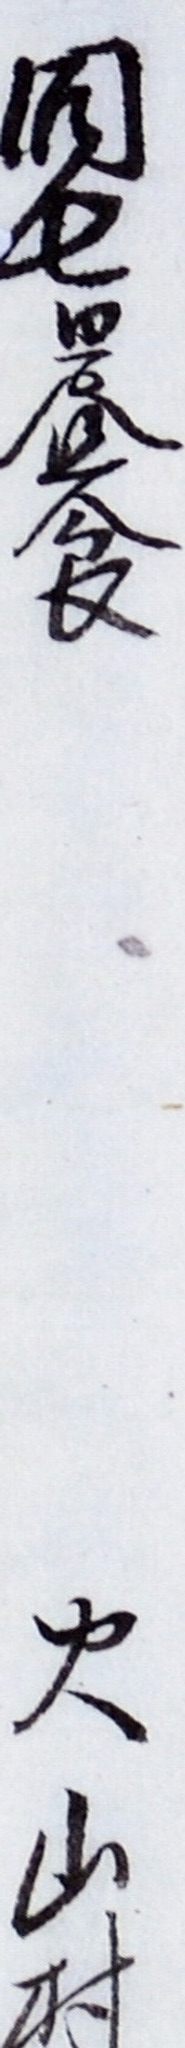同七日昼食火山村
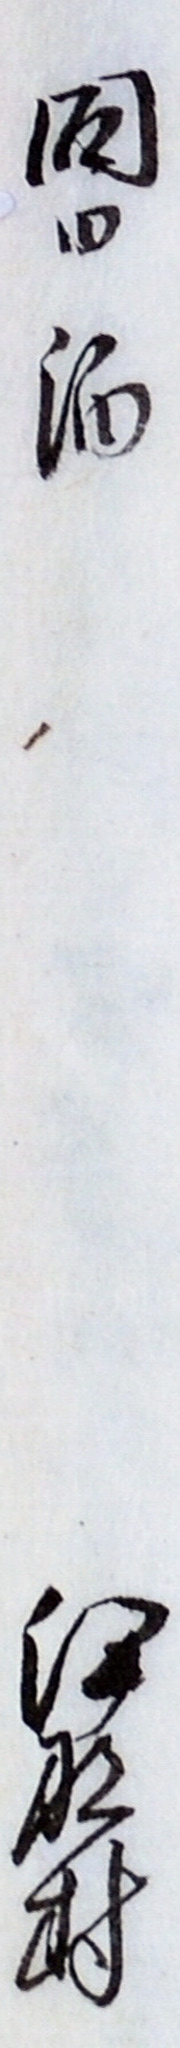同日泊伊那村
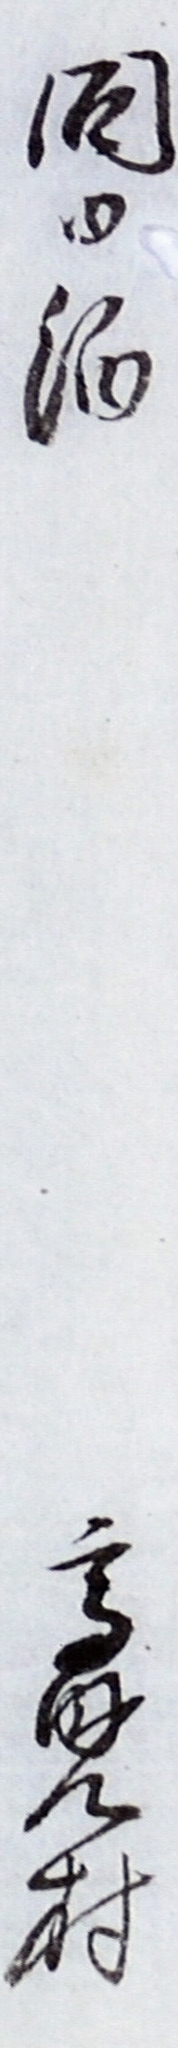同日泊高見村
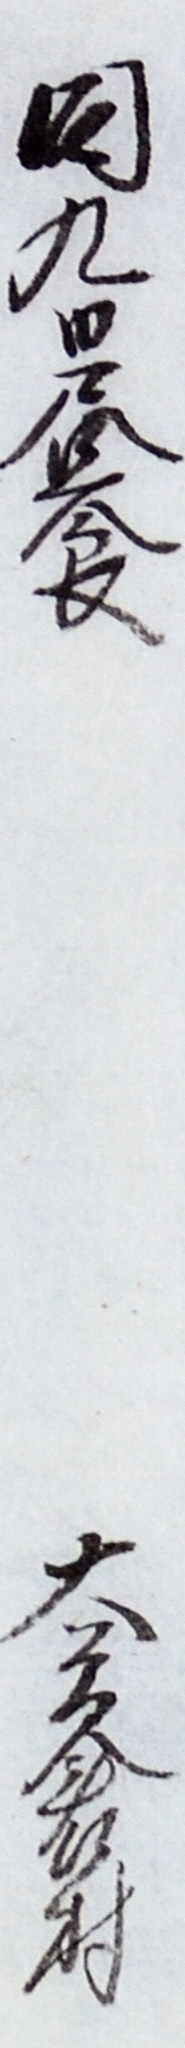同九日昼食大曽倉村
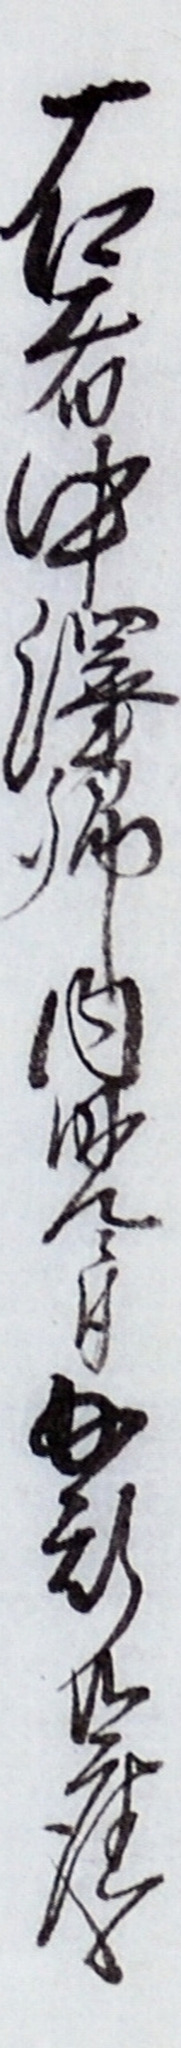右者中沢郷内見ニ付如斯御座候
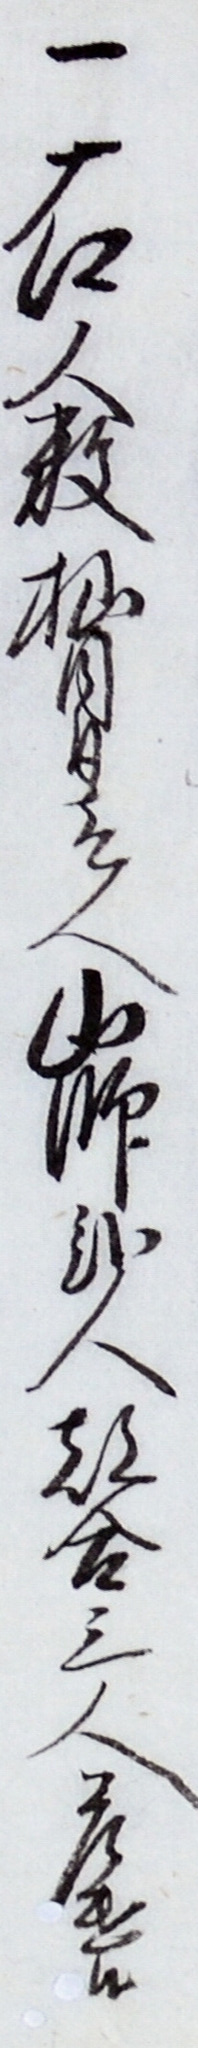一右人数杣目付壱人山師弐人都合三人差遣候
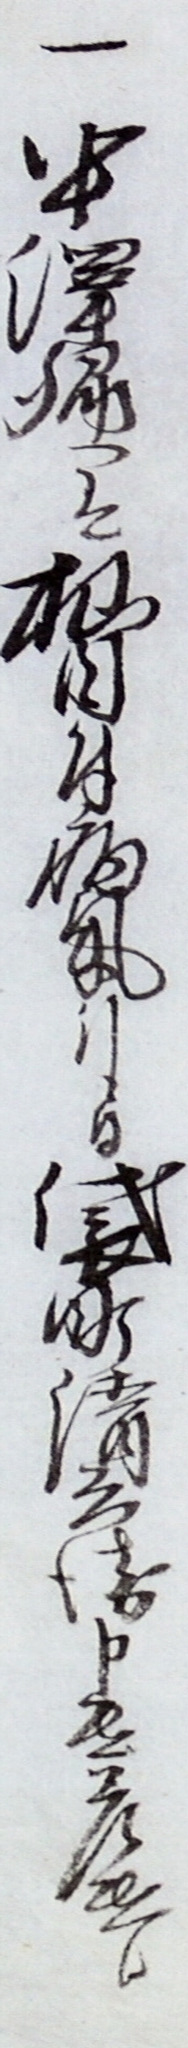一中沢郷へは杣目付病気引ニ付袋町清兵衛申遣差遣候
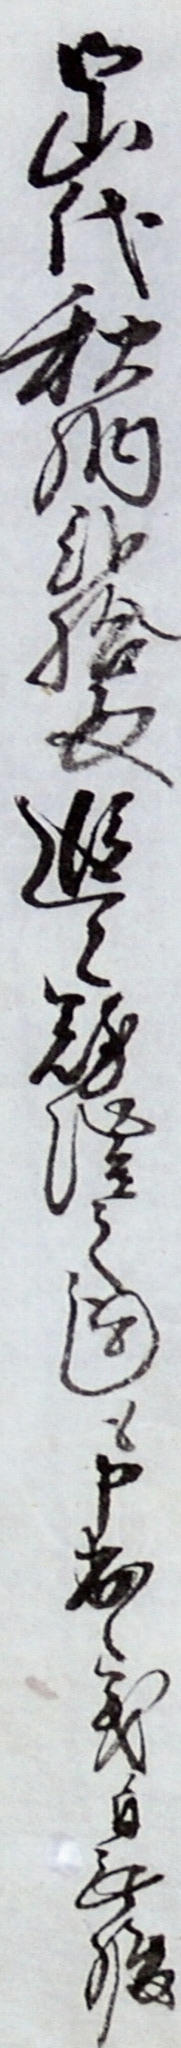御山代秋納弐拾匁追々難渋之趣も申出候義ニ付無残
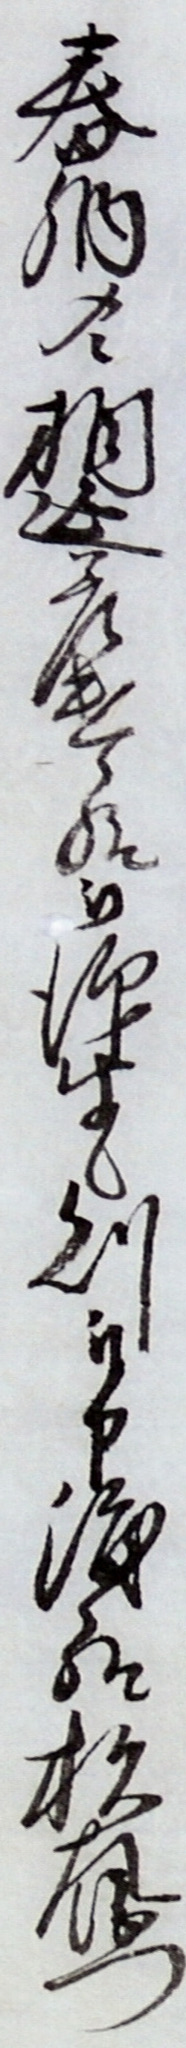春納メニ相延差遣候様被仰付も則被申渡候杉右衛門

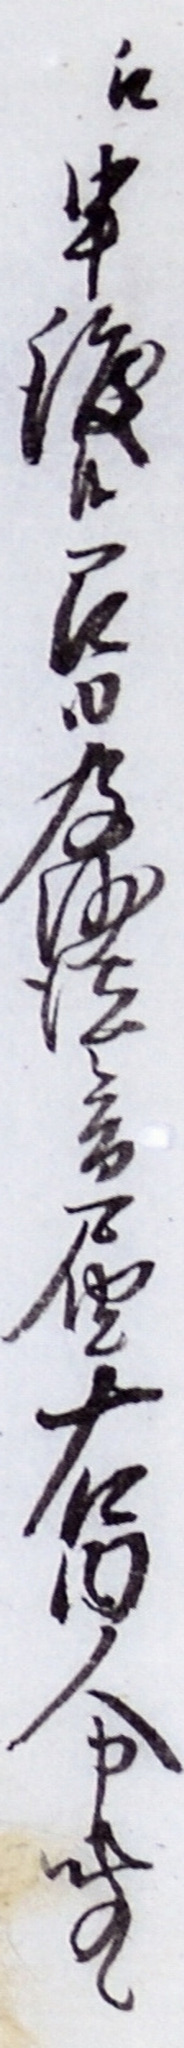江申渡候即日及沙汰之旨届右内人申聞候
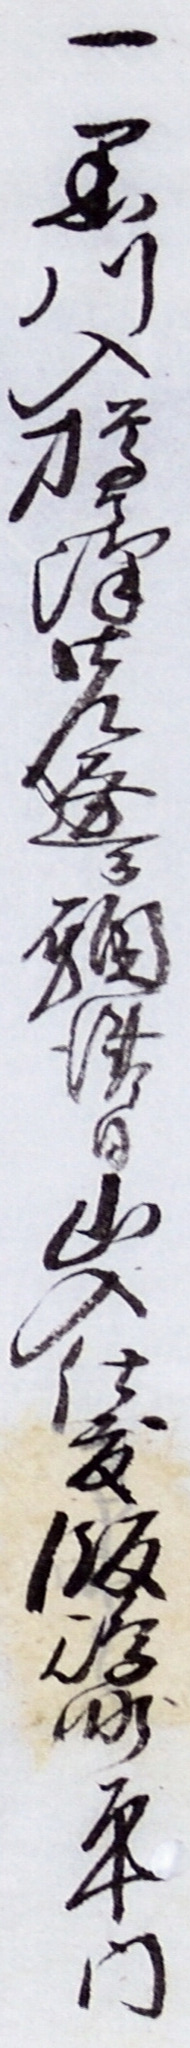一黒川入樽ヶ沢御先達て願場に付山入仕度飯嶋町平川
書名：御山奉行御用控
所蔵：伊那市立高遠町図書館・合同会社AMANE
